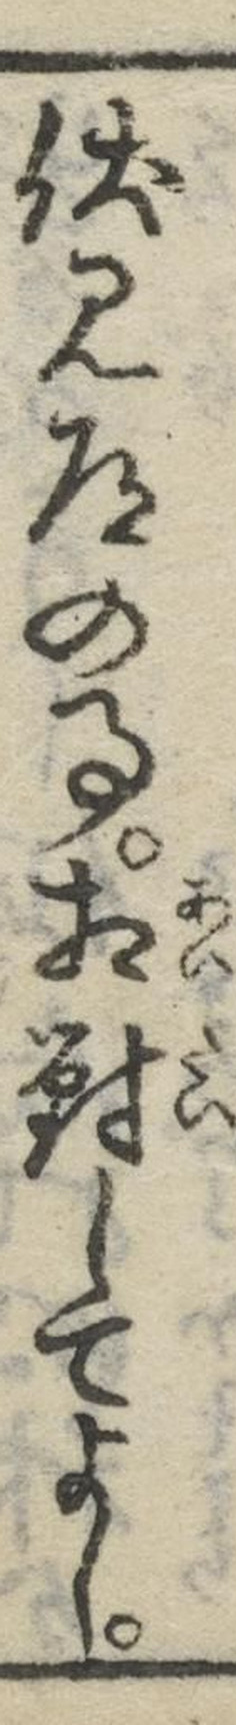伏見屋の事。相対してよし。
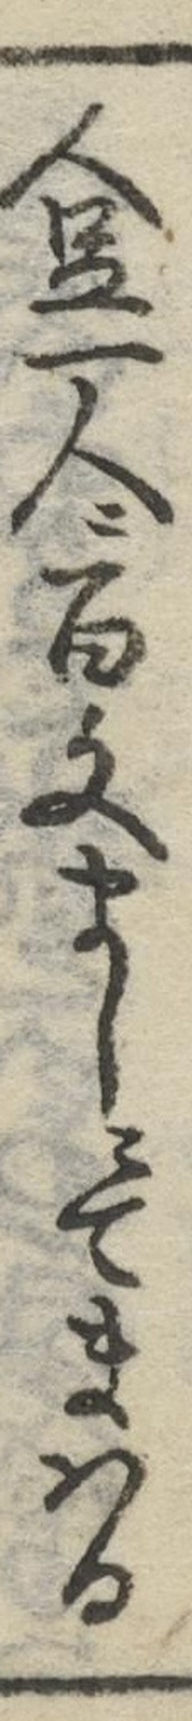人足一人に百文ましにてまはる
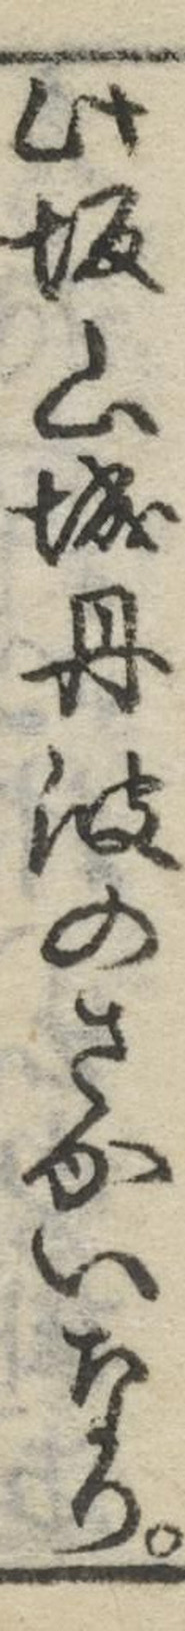此坂山城丹波のさかいなり。
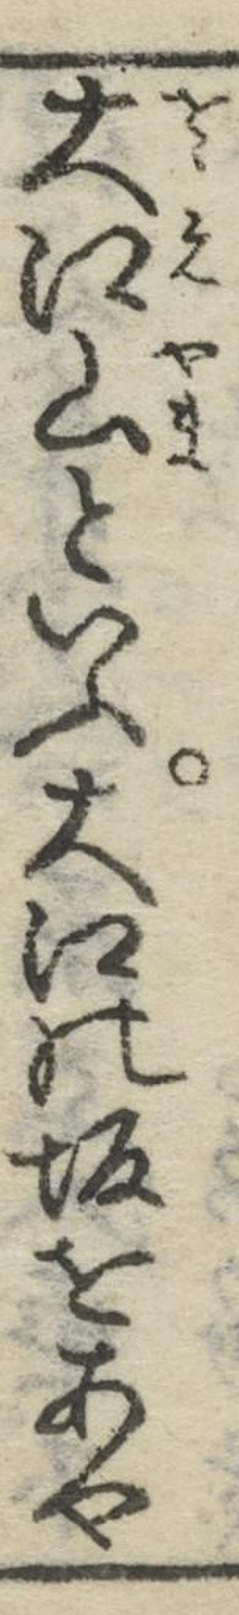大江山といふ。大江の坂をあや
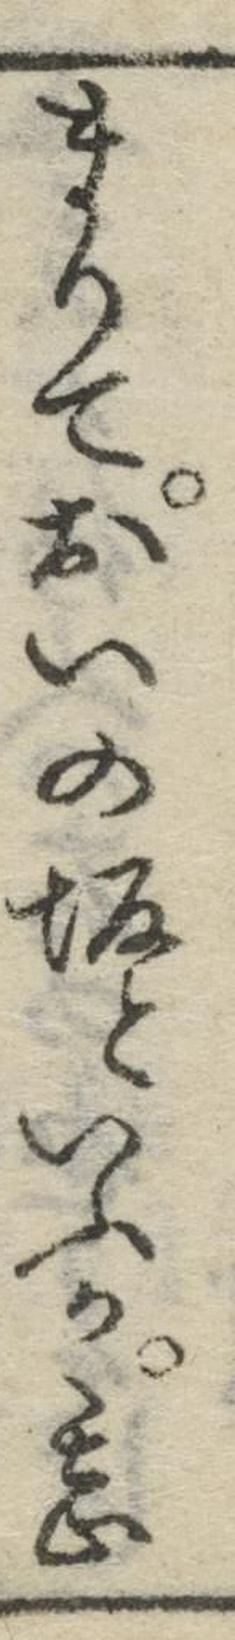まりて。おいの坂といふか。甚
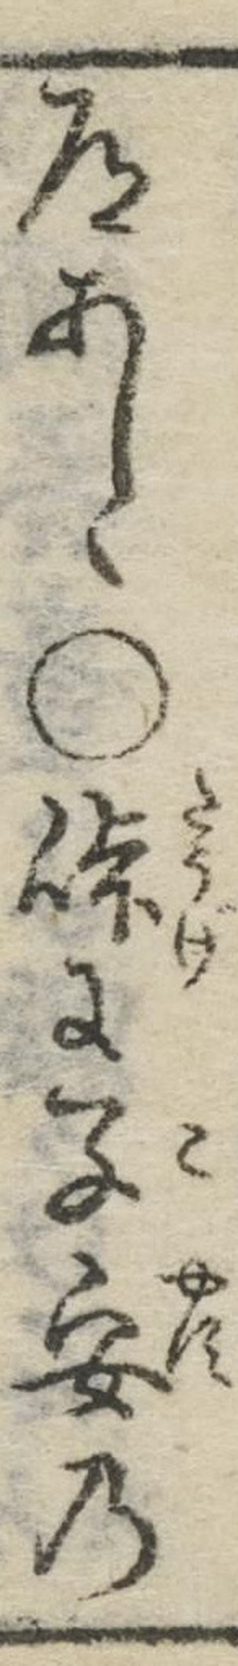道あしゝ〇峠に子安の
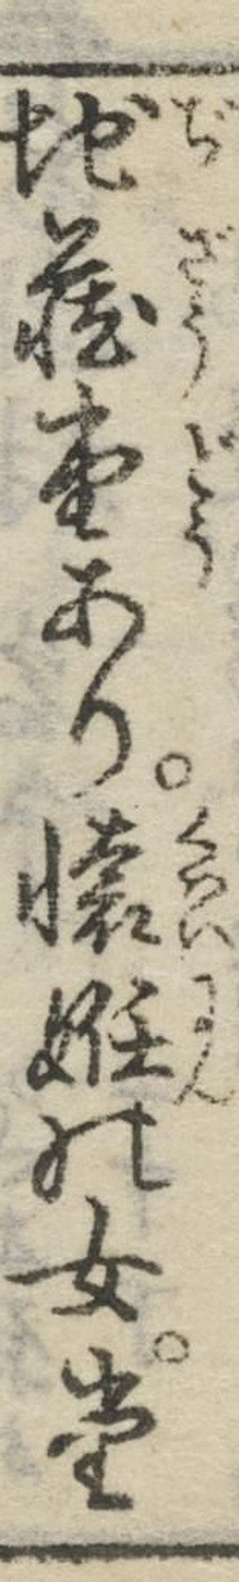地蔵堂あり。懐妊の女。堂
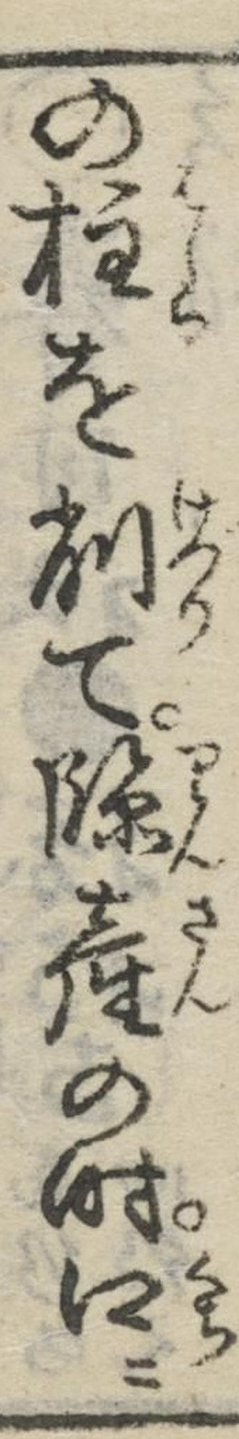の柱を削て。臨産の時。口に
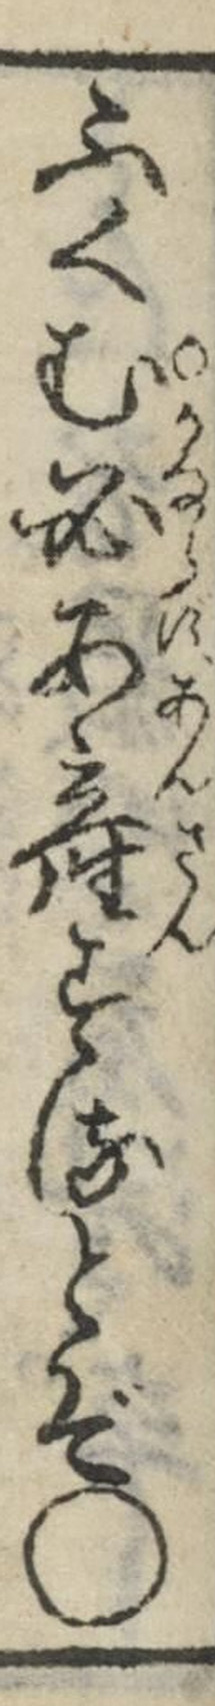ふくむ。必安産するとぞ〇
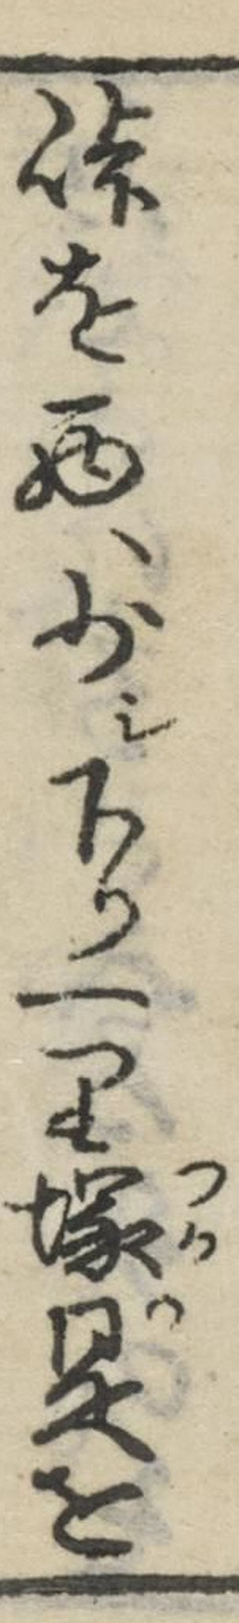峠を西へ少し下り一里塚。是を
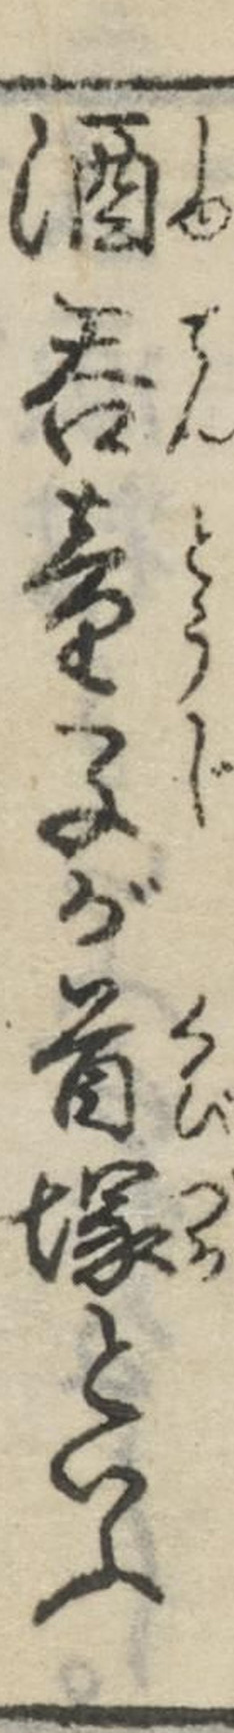酒呑童子が首塚といふ
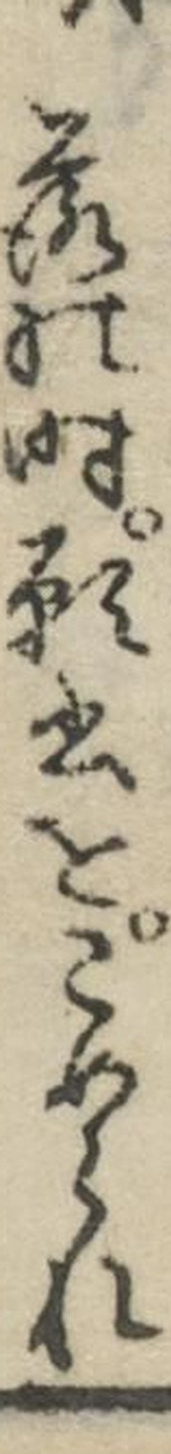落の時。願書を。こめられ
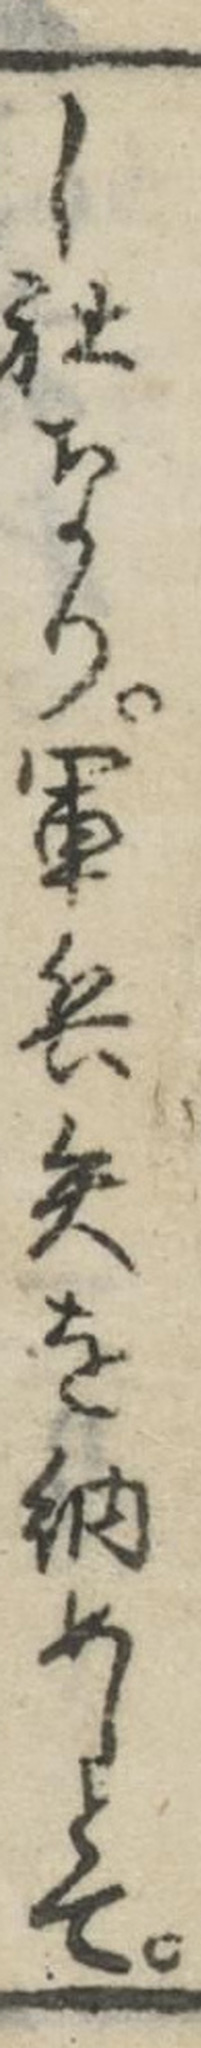し社なり。軍兵矢を納めしとて。
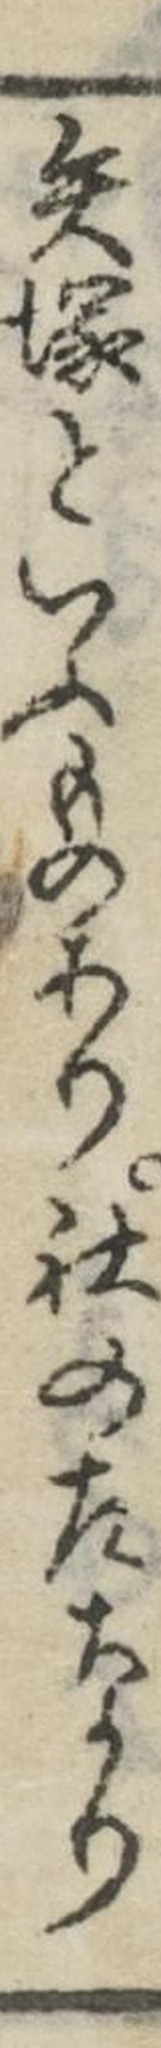矢塚といふものあり。社の左なり
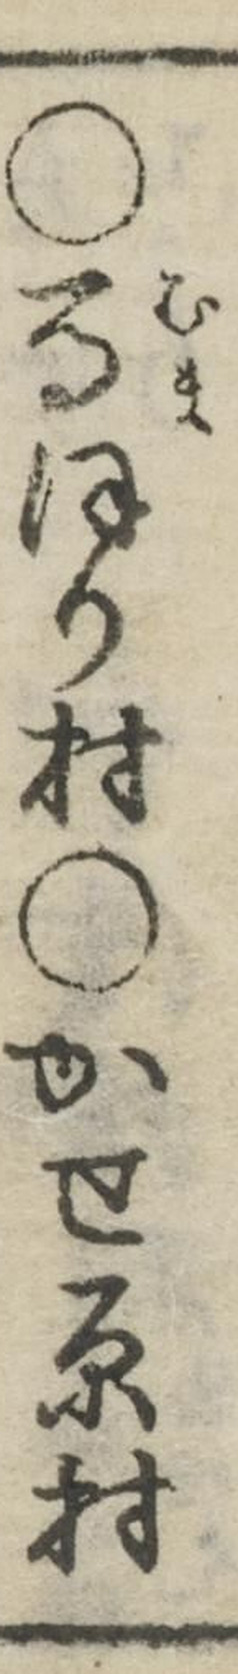〇馬ほり村〇かせ原村
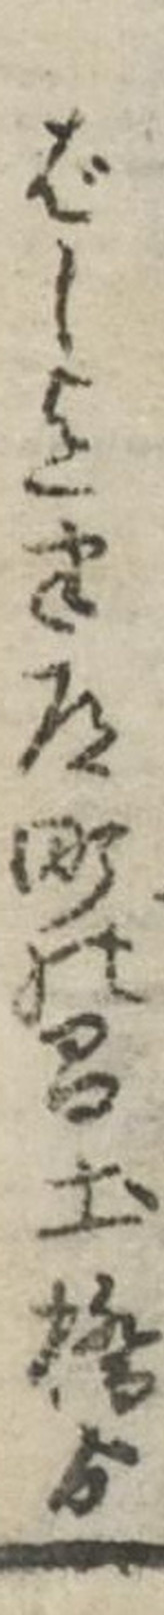ばし迄半道町の召土橋ゟ
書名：但州城崎浴湯辧
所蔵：東京大学地震研究所図書室 Earthquake Research Institute Library, The University of Tokyo, JAPAN
